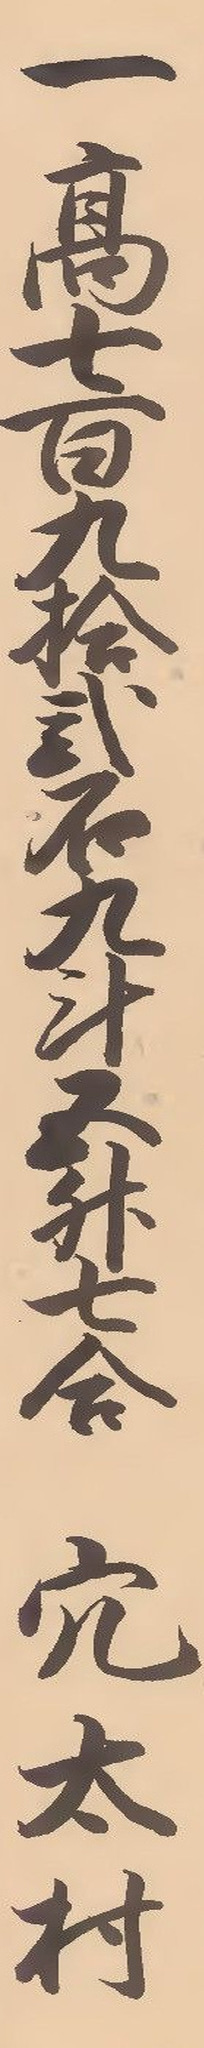一高七百九拾弐石九斗五升七合穴太村
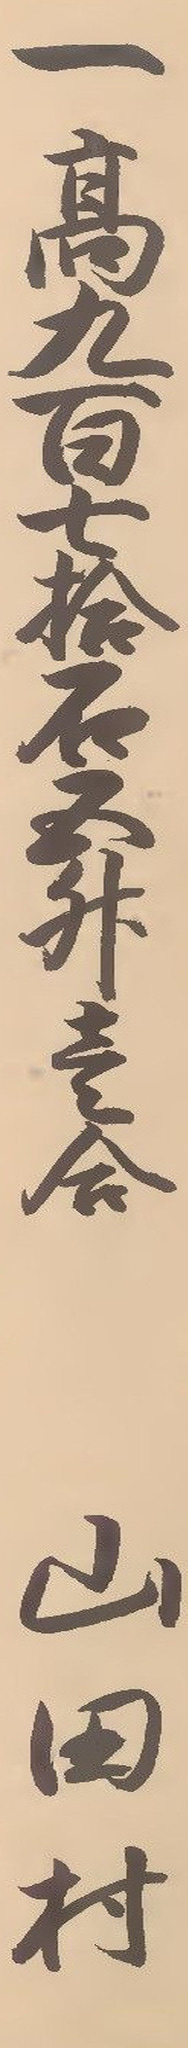一高九百七拾石五升壱合山田村

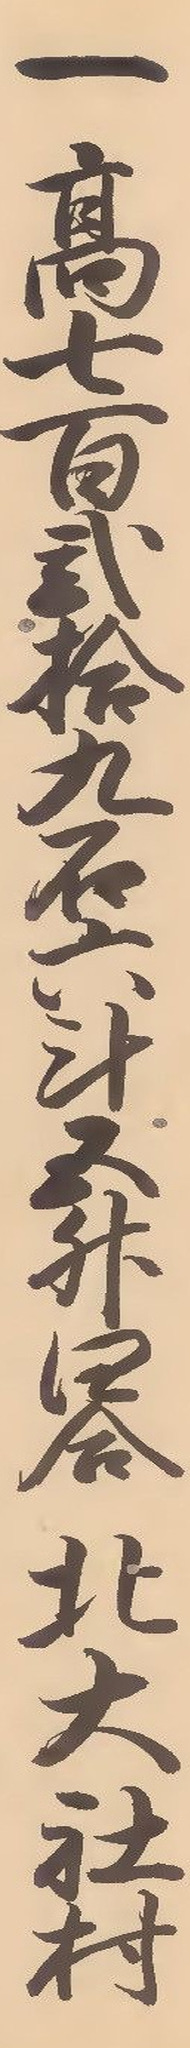一高七百弐拾九石六斗五升四合北大社村
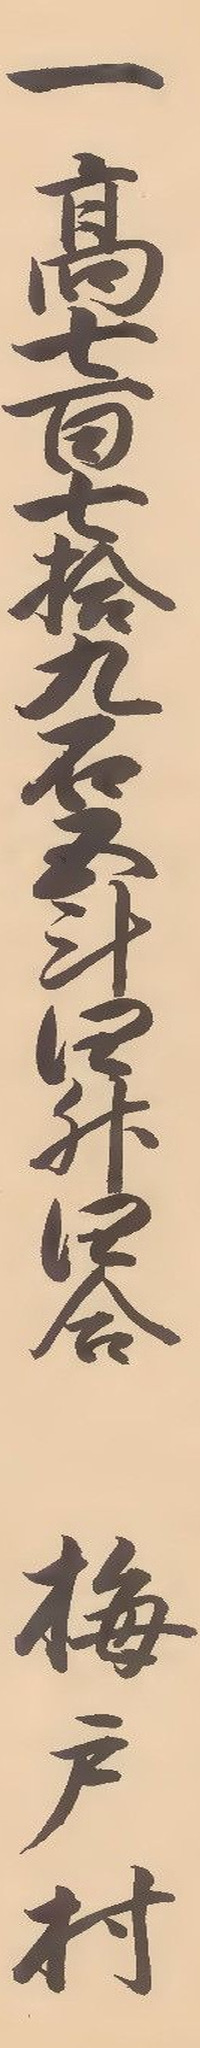一高七百七拾九石五斗四升四合梅戸村
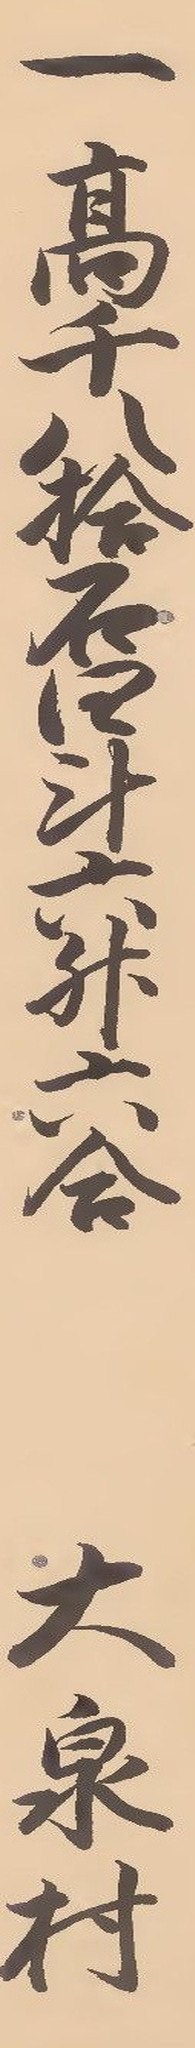一高千八拾石四斗六升六合大泉村

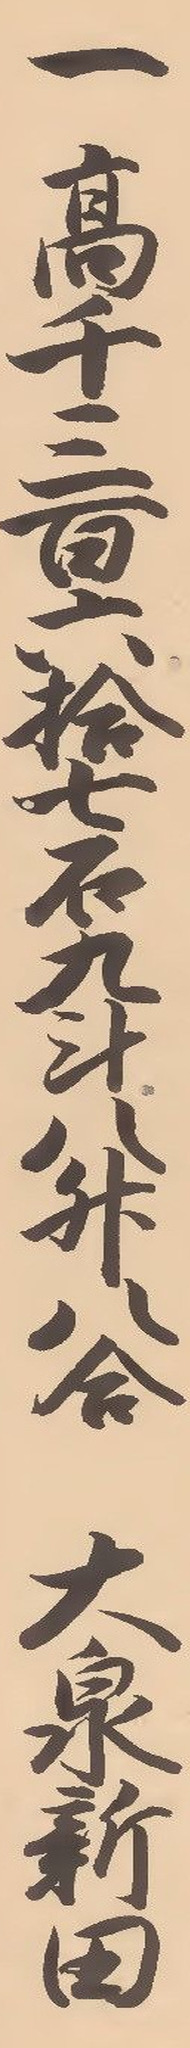一高千三百六拾七石九斗八升八合大泉新田
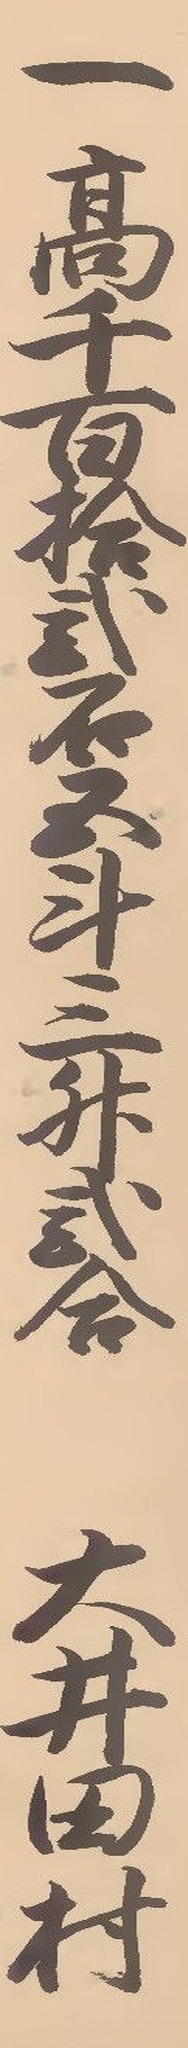一高千百拾弐石五斗三升弐合大井田村
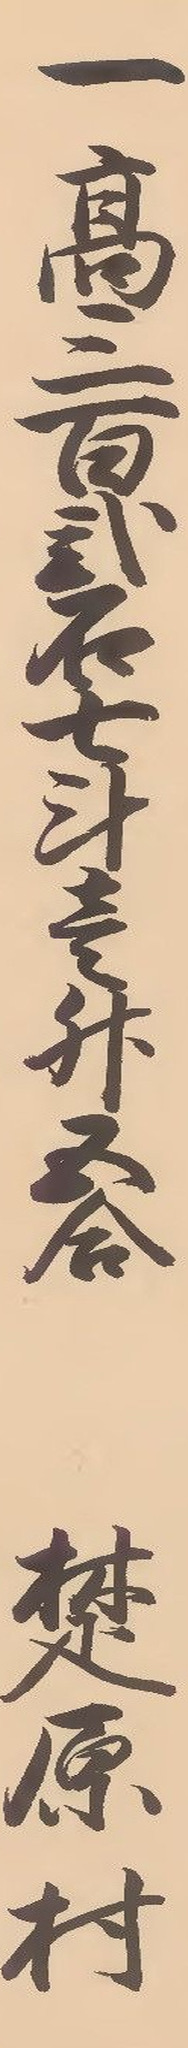一高三百弐石七斗壱升五合楚原村
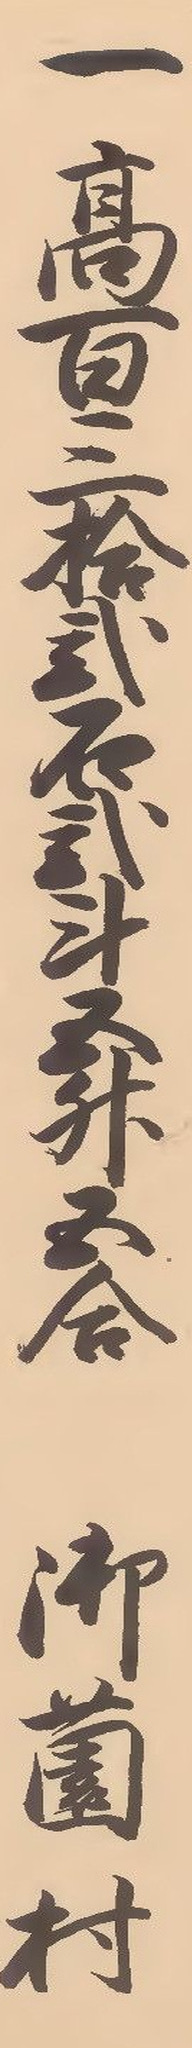一高百三拾弐石弐斗五升五合御薗村
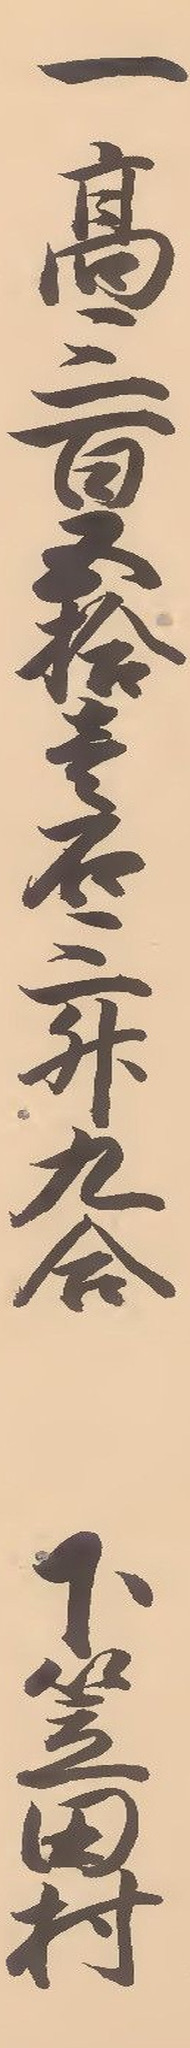一高三百五拾壱石三升九合下笠田村

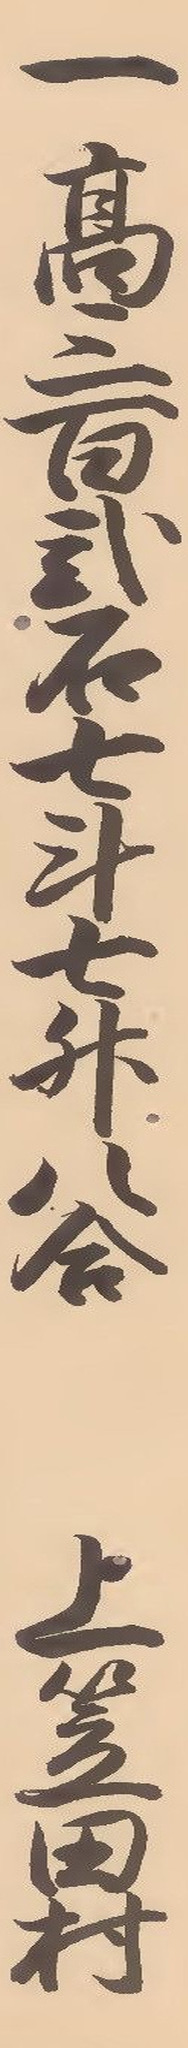一高三百弐石七斗七升八合上笠田村
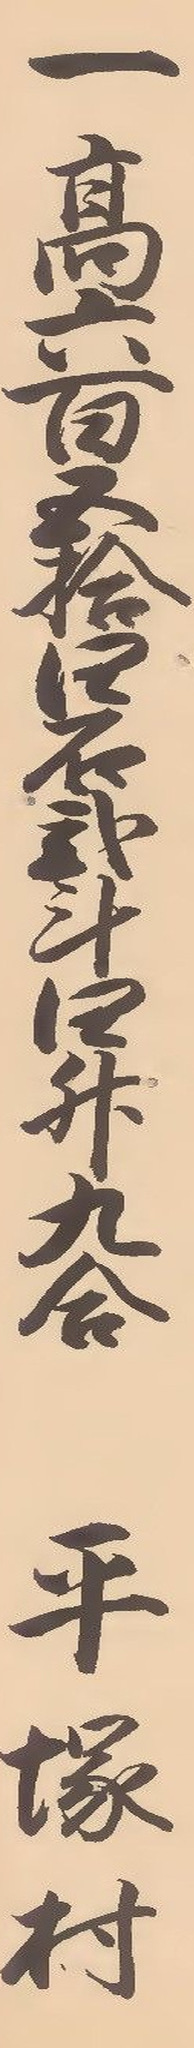一高六百五拾四石弐斗四升九合平塚村
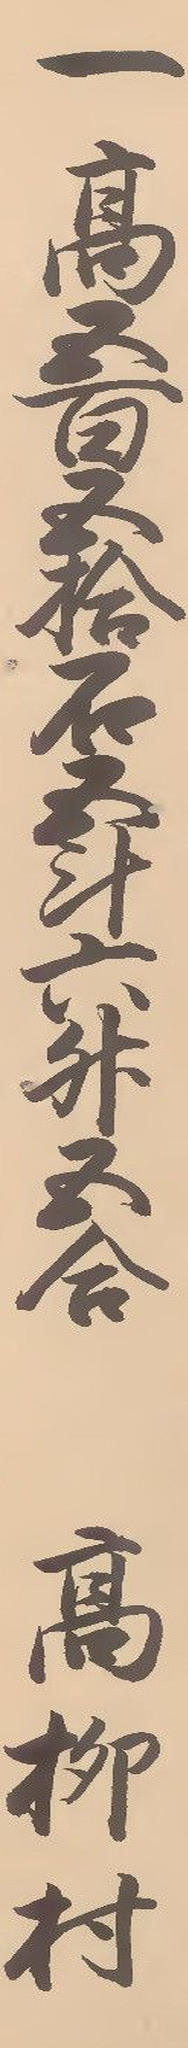一高五百五拾石五斗六升五合高柳村
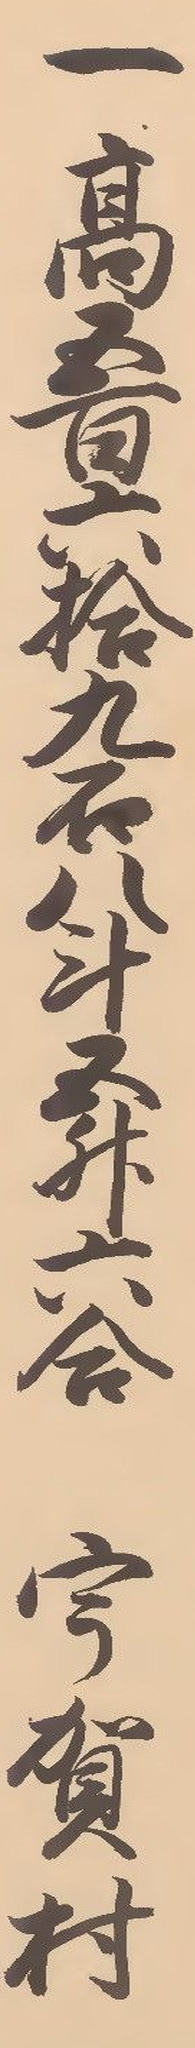一高五百六拾九石八斗五升六合宇賀村
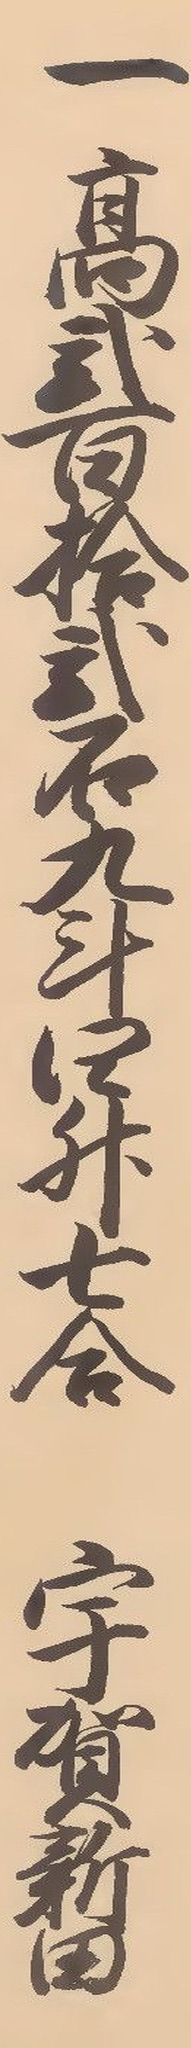一高弐百拾弐石九斗四升七合宇賀新田

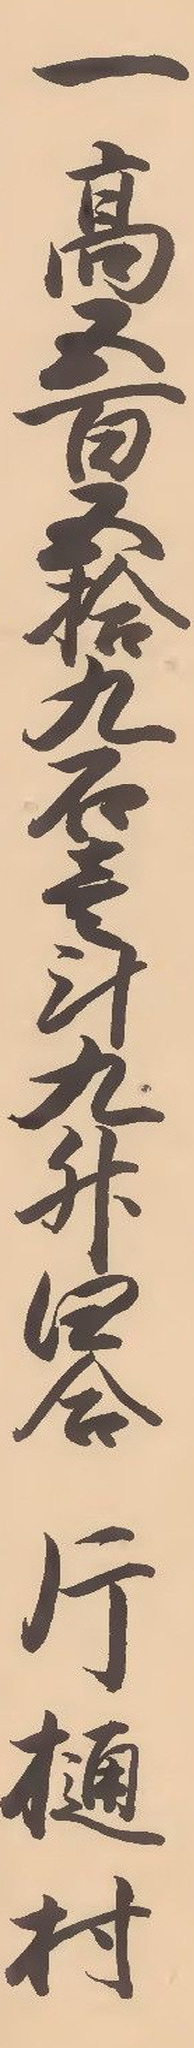一高五百五拾九石壱斗九升四合片樋村
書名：伊勢国郷帳
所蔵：国立公文書館 National Archives of Japan
